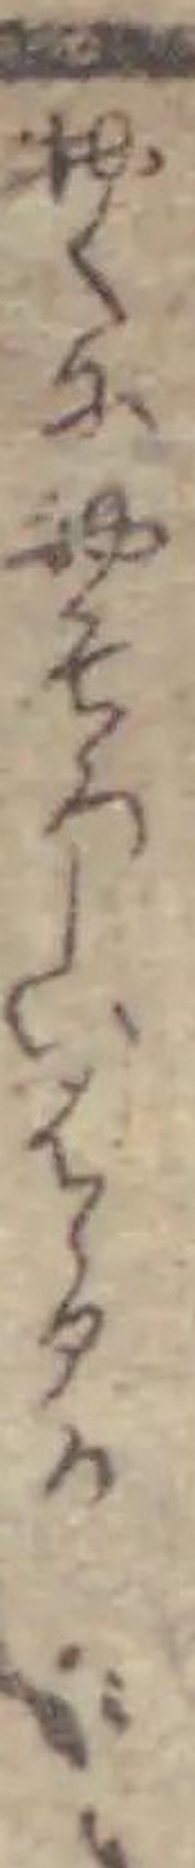おくにおそろしいはゝあか
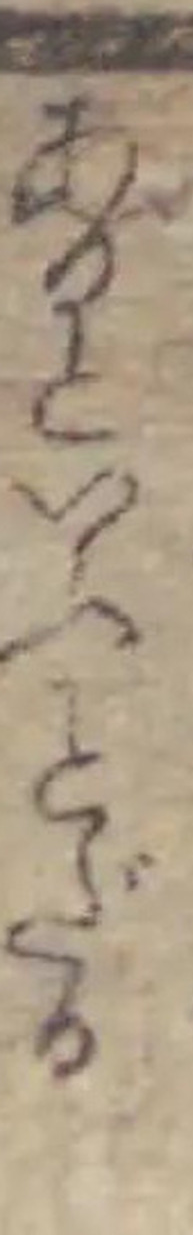あるといふことだか
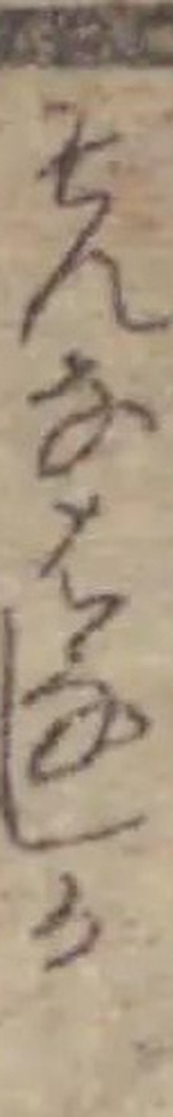そんなはなしか
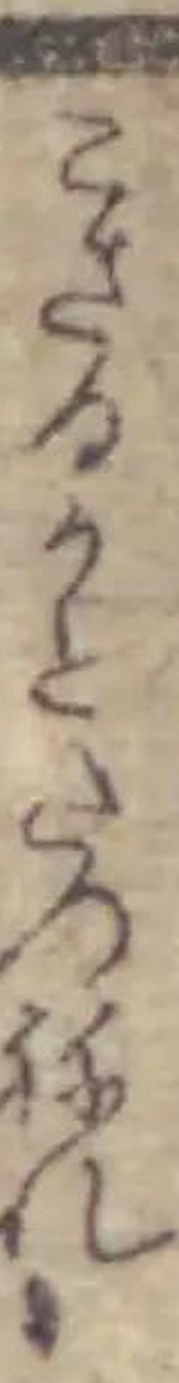こさるかとたつねれ
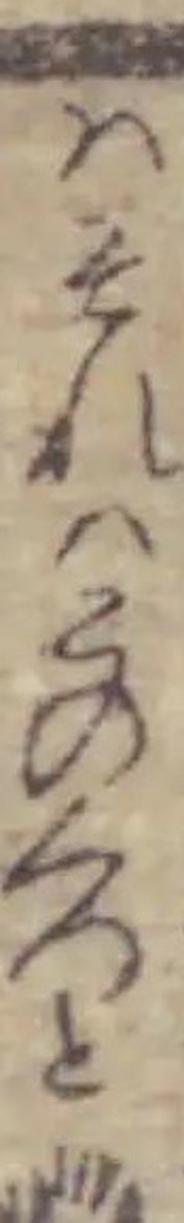はそれはこのくつと
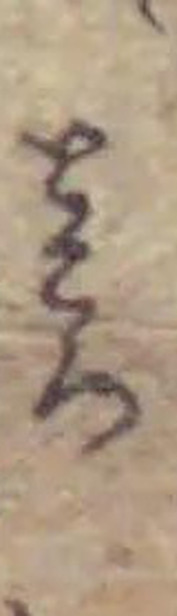ところ
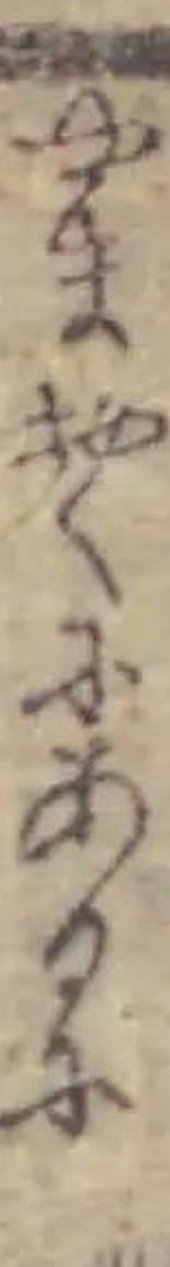やまおくにあるに
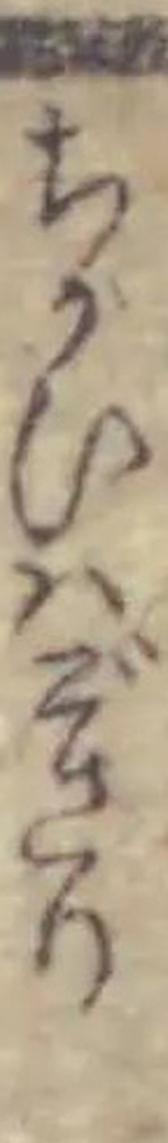ちかひはごさり
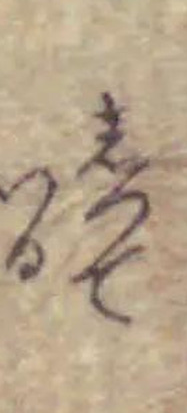しつて
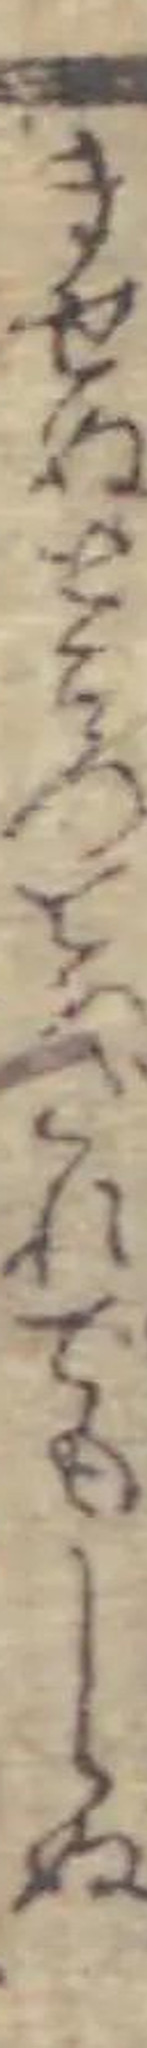ませぬところてはだれでもしらぬ
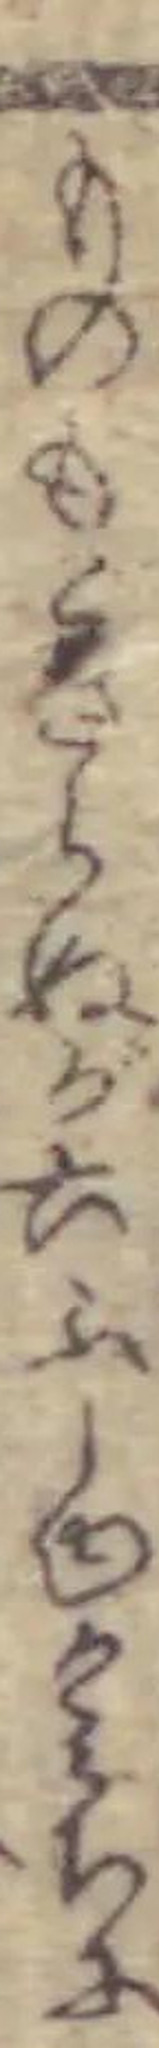ものもこさらぬが六ぶしゆかみちに
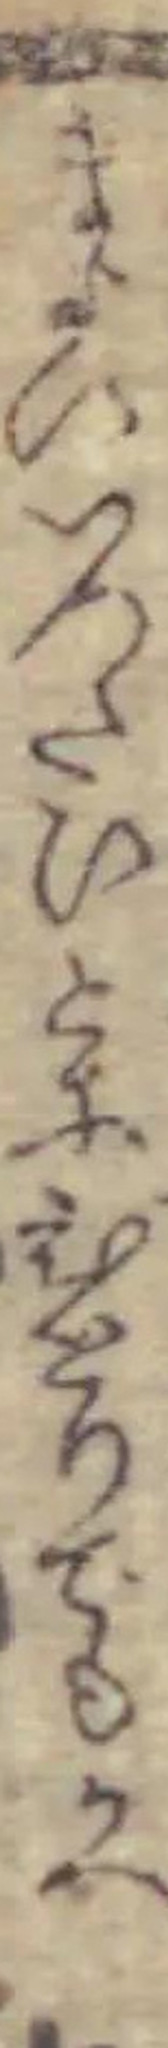まよいいつたひとにひとりでもかへ
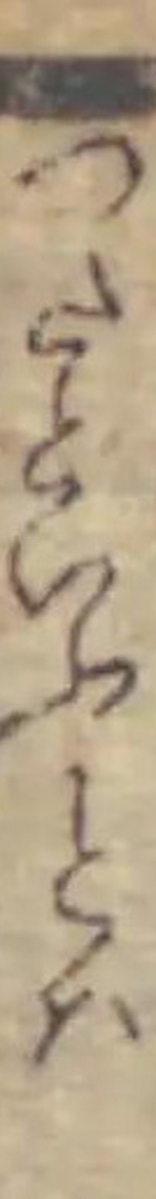つたといふことは
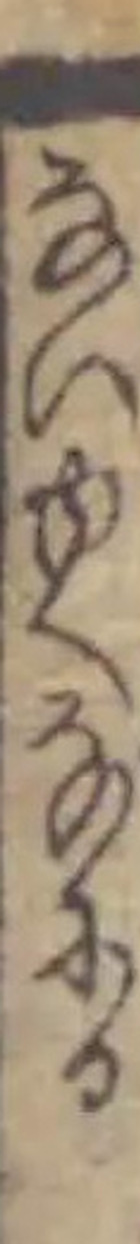ないゆへなにか
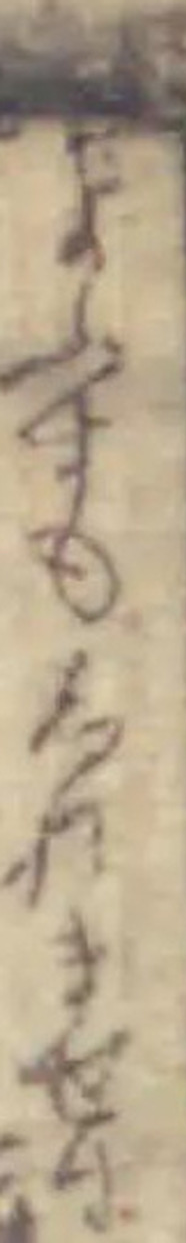よふすもしれませす
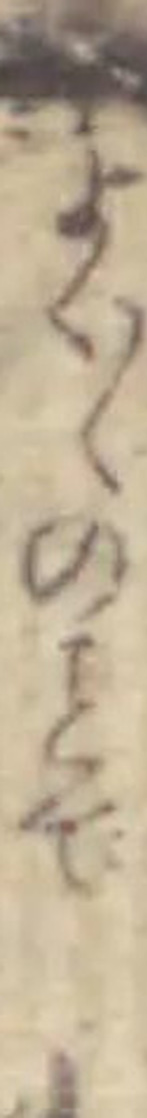よく〳〵のことで
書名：もふもふもふ怖噺 2巻
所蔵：国立国会図書館 National Diet Library, JAPAN
